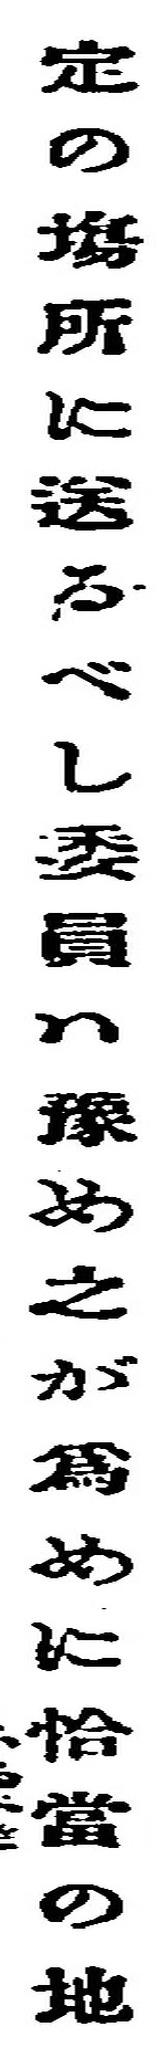定の場所に送るべし委員は予め之が為めに恰当の地
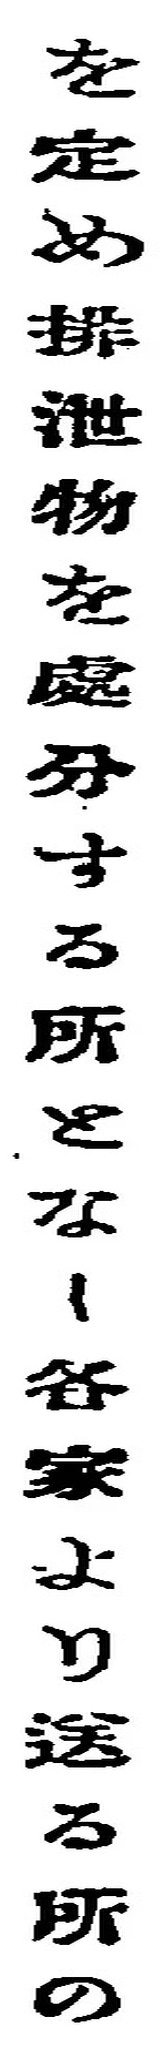を定め排泄物を処分する所となし各家より送る所の
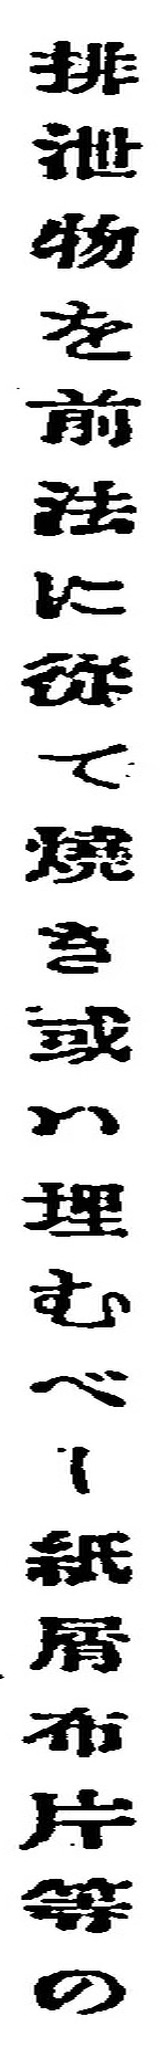排泄物を前法に従て焼き或は埋むべし紙屑布片等の
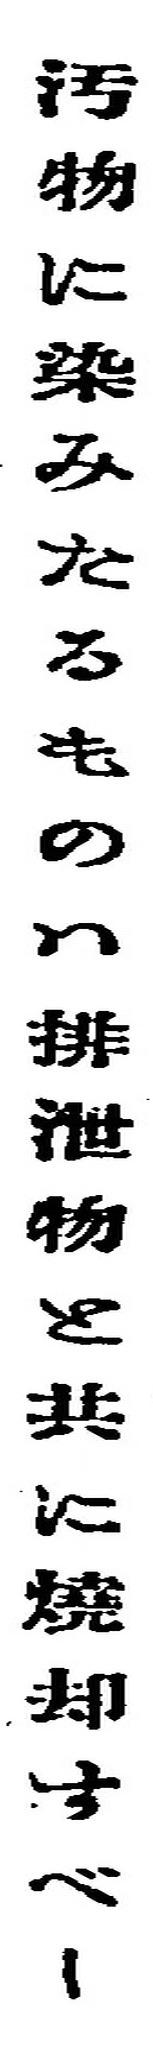汚物に染みたるものは排泄物と共に焼却すべし
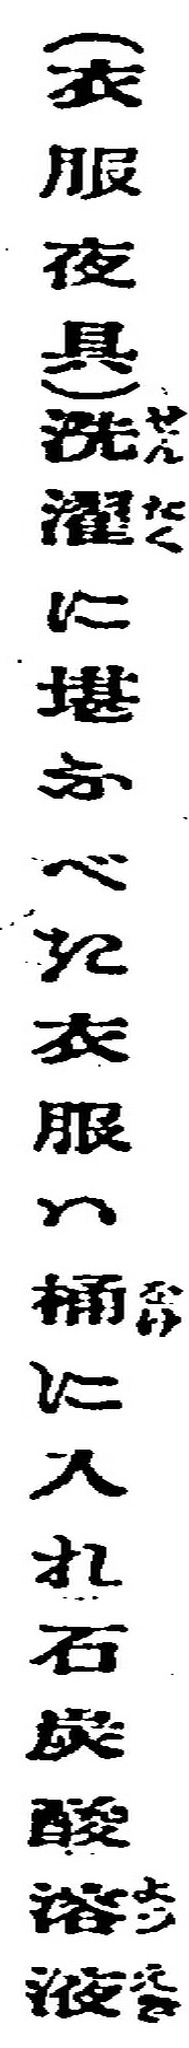(衣服夜具)洗濯に堪ふべき衣服は桶に入れ石炭酸溶液
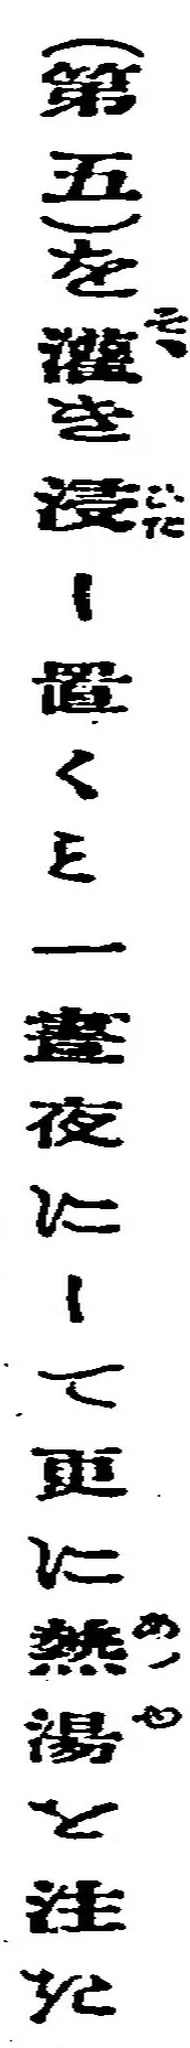(第五)を灌き浸し置くこと一昼夜にして更に熱湯を注き

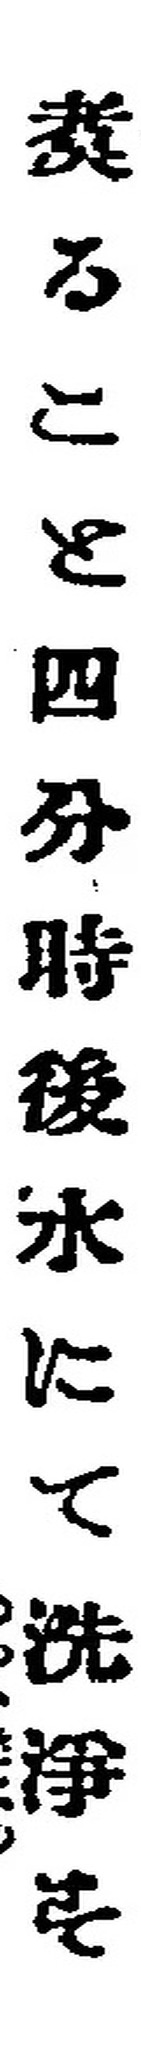煮ること四分時後水にて洗浄す
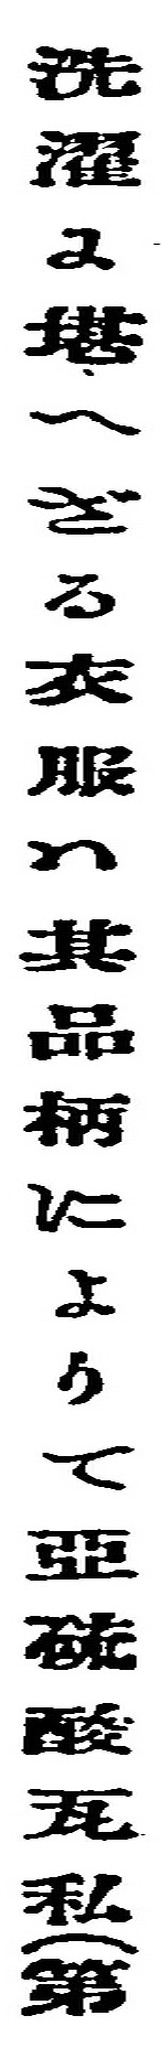洗濯に堪へざる衣服は其品柄によりて亜硫酸瓦私(第
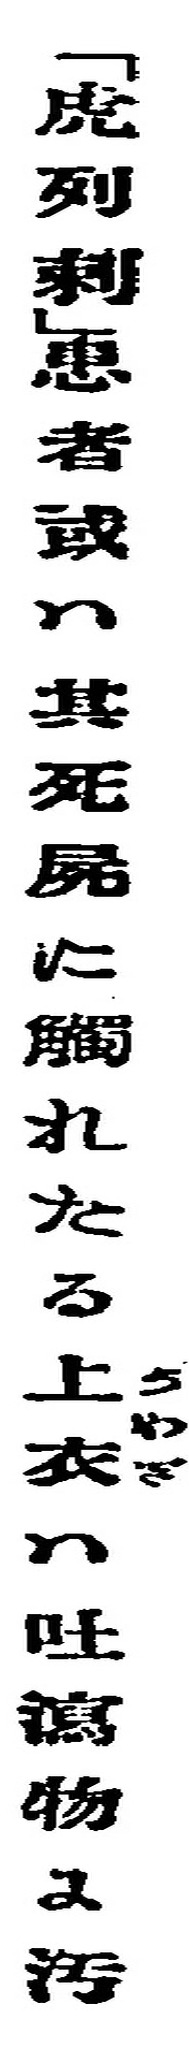「虎列刺」患者或は死屍に触れたる上衣は吐瀉物に汚
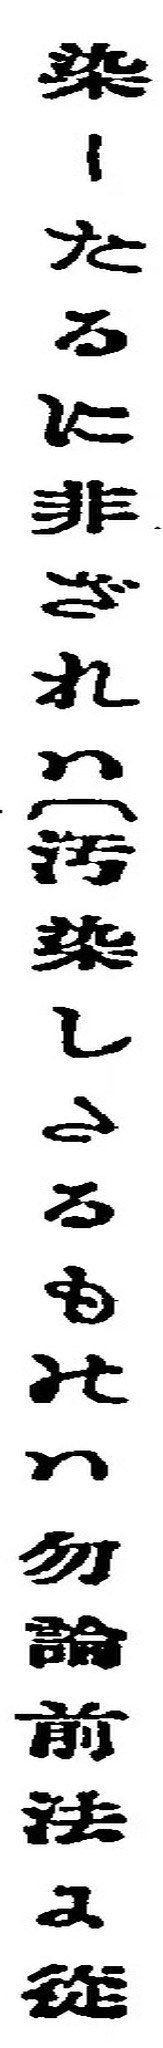染したるに非ざれは[汚染したるものは勿論前法に従
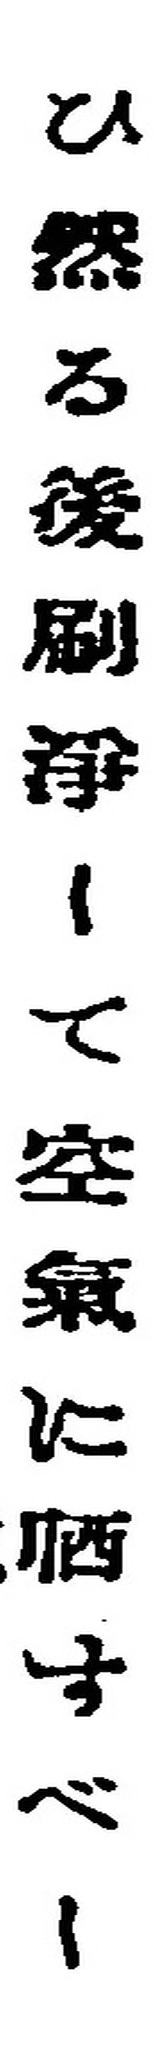ひ然る後刷浄して空気に晒すべし
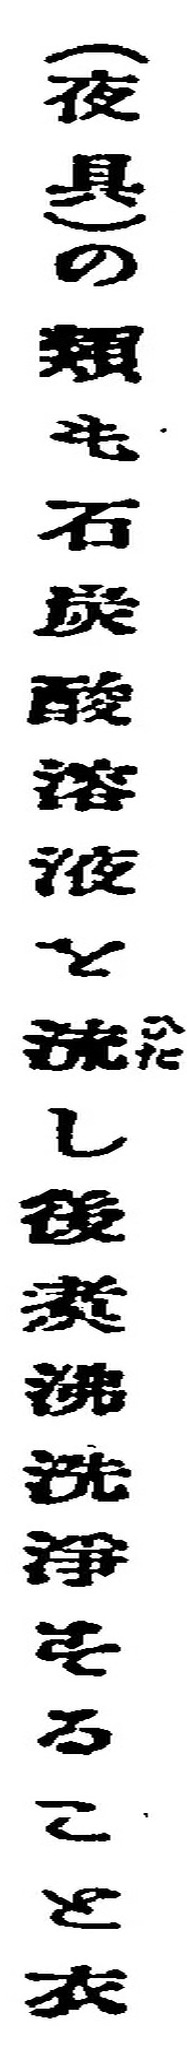(夜具)の類も石炭酸溶液を流し後煮沸洗浄すること衣
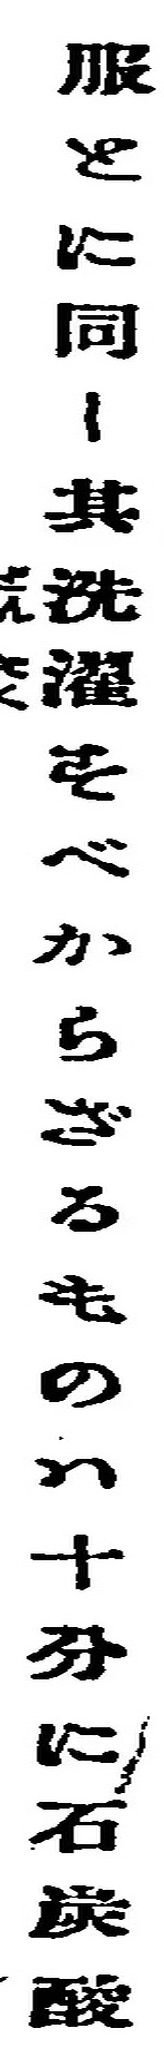服とに同し其洗濯すべからざるものは十分に石炭酸
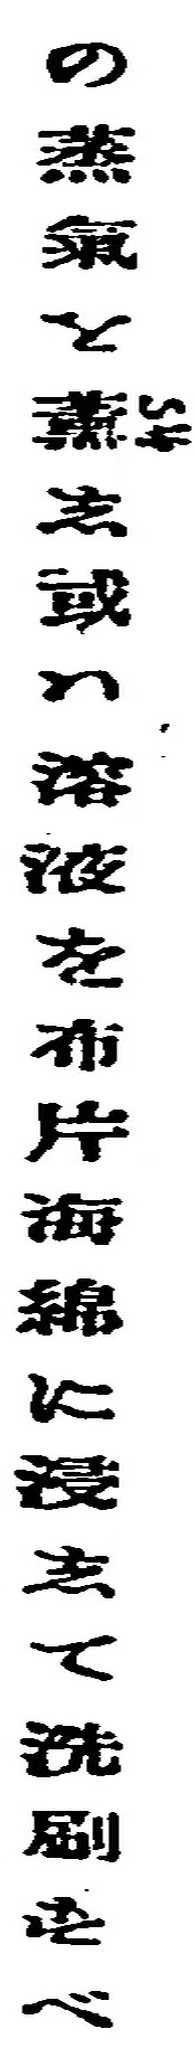の蒸気を薫し或は溶液を布片海綿に浸して洗刷すべ
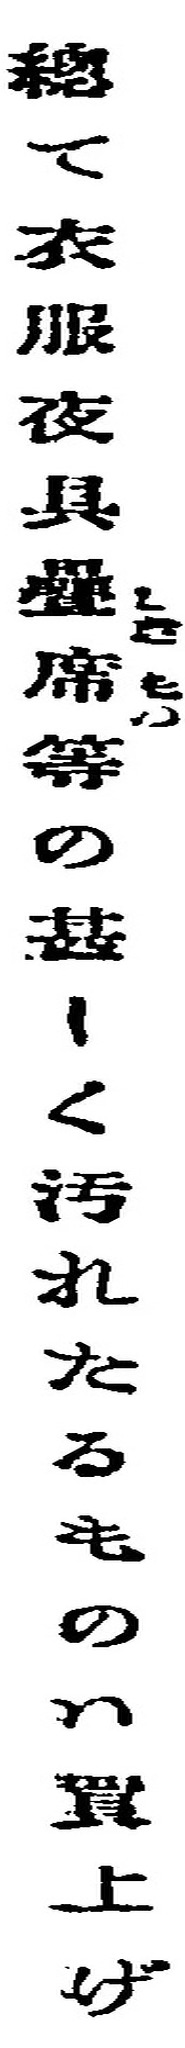総て衣服夜具畳席等の甚しく汚れたるものは買上げ
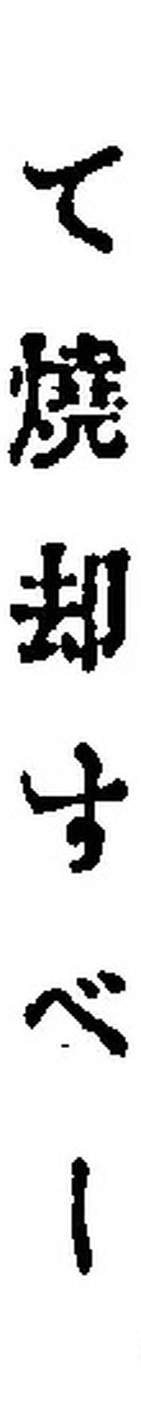て焼却すべし
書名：これら病予防心得
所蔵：国立国会図書館 National Diet Library, JAPAN
